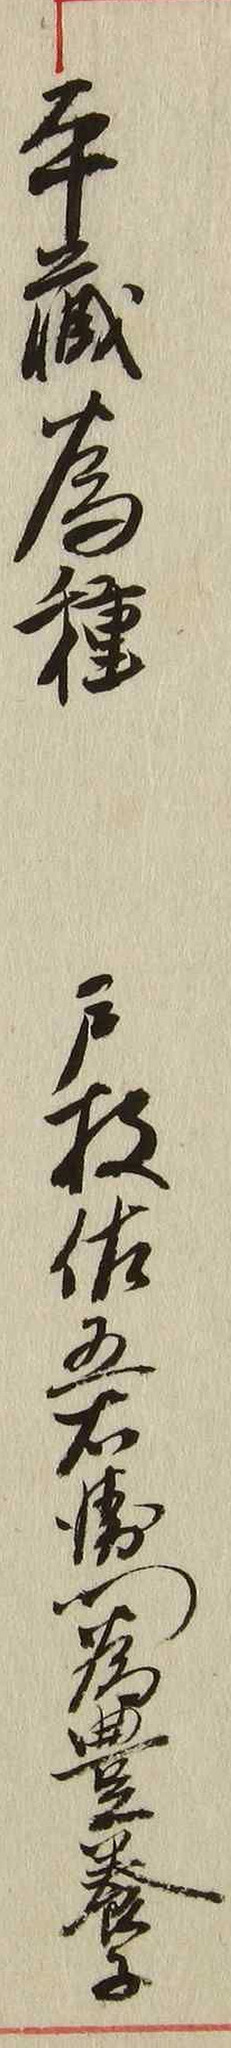平蔵為種戸枚佐五右衛門為豊養子
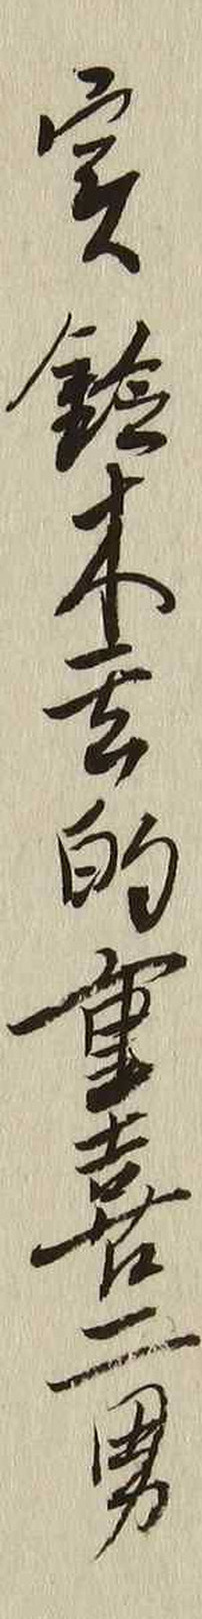実鈴木玄的重喜二男
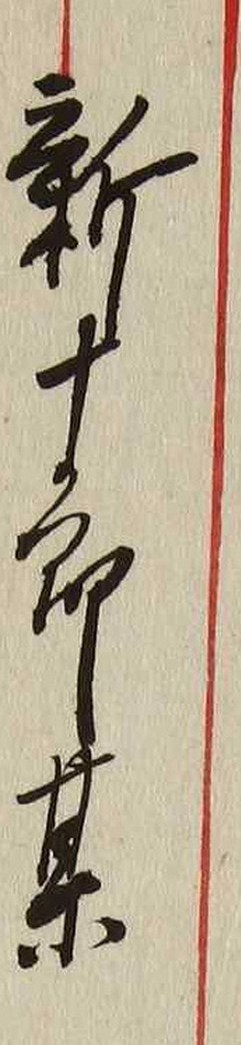新十郎某
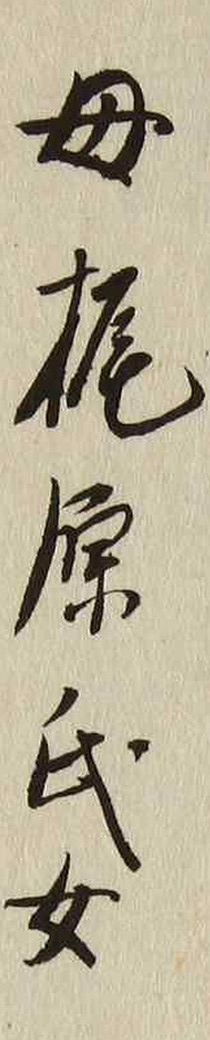母梶原氏女
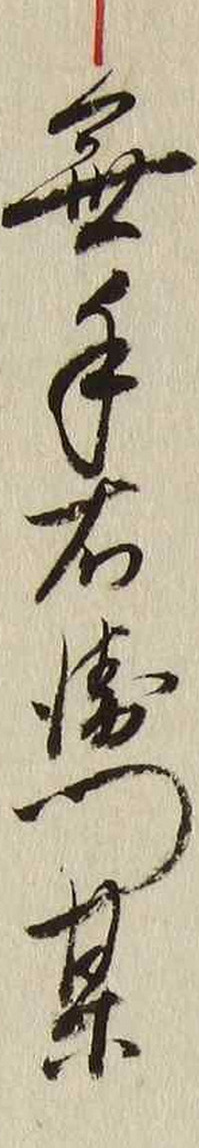無手右衛門某
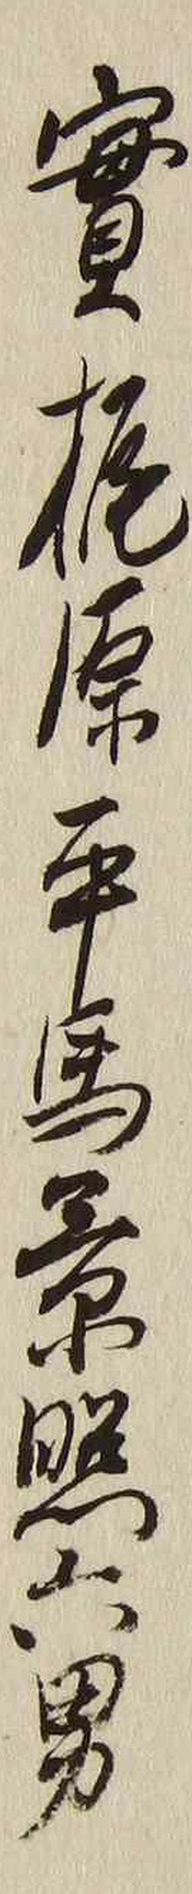実梶原平馬景照六男
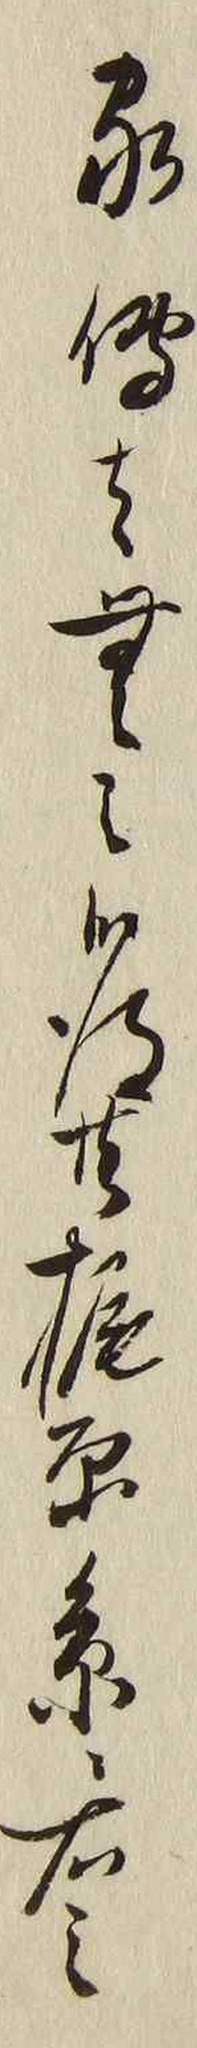家伝者無之候得共梶原系ニ右之

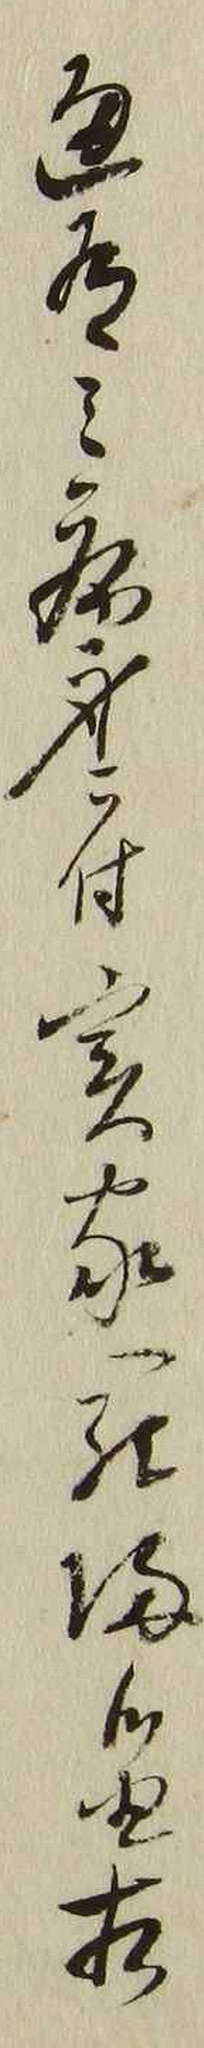通有之病身ニ付実家へ罷帰候由相
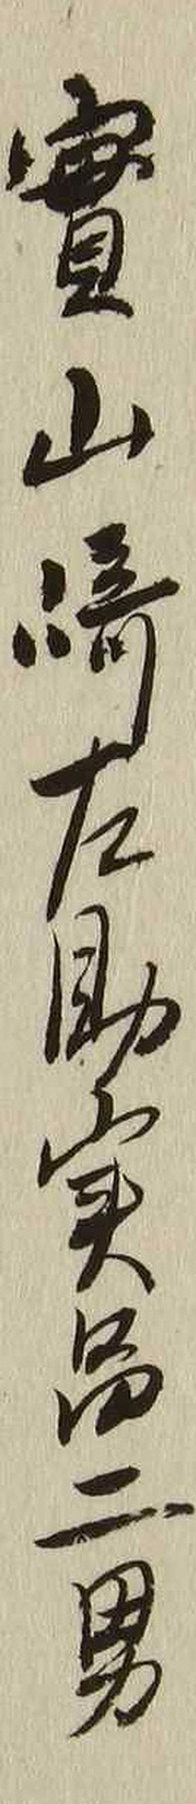実山崎左助実品二男
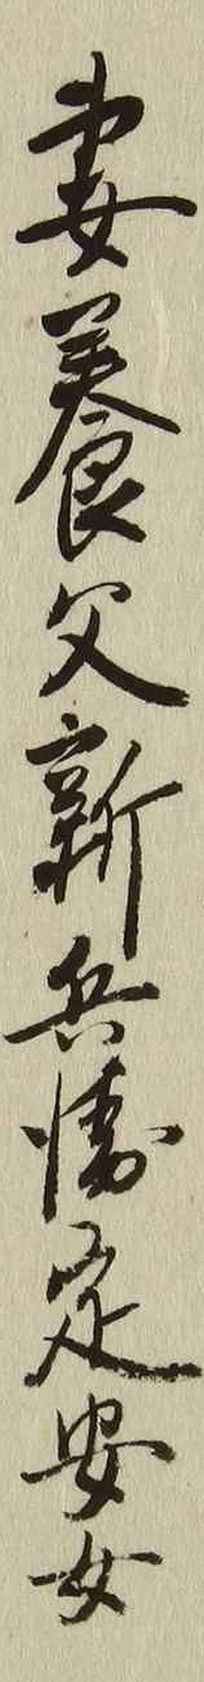妻養父新兵衛定安女
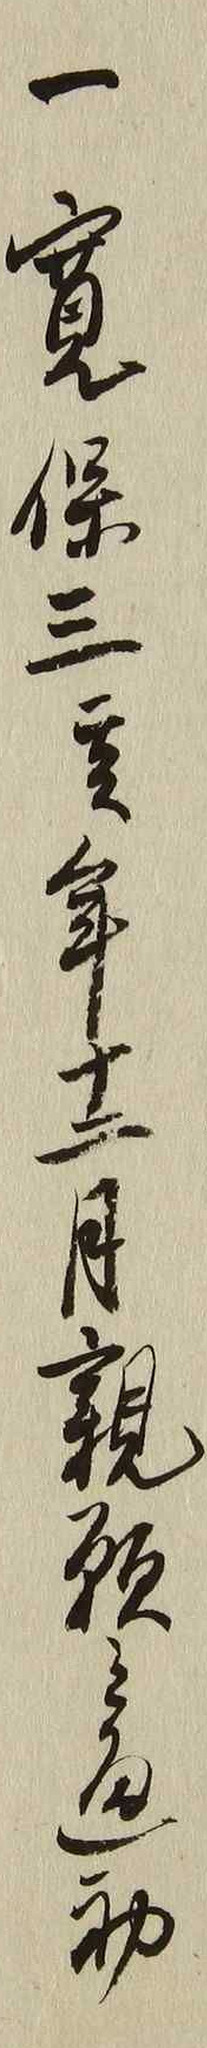一寛保三亥年十二月親願之通初
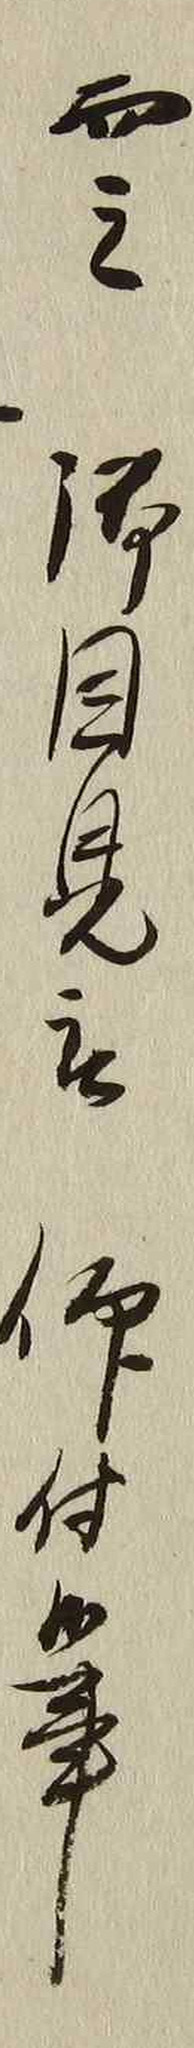而之御目見被仰付候事
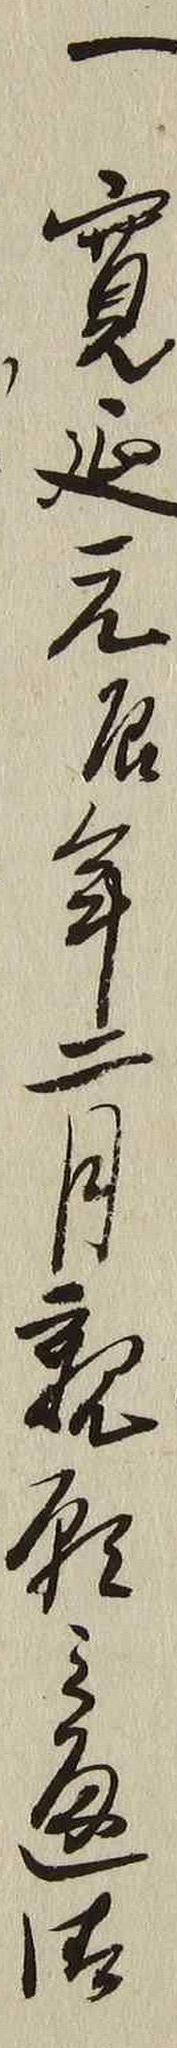一寛延元辰年二月親願之通御
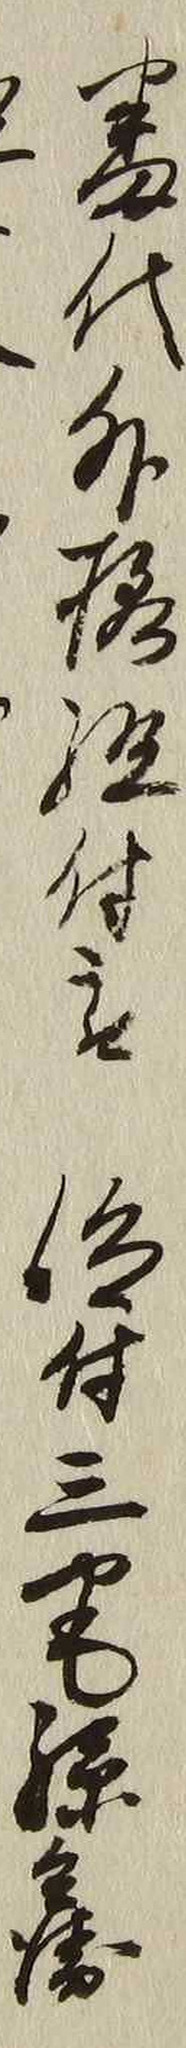番代外様組付被仰付三宅孫兵衛
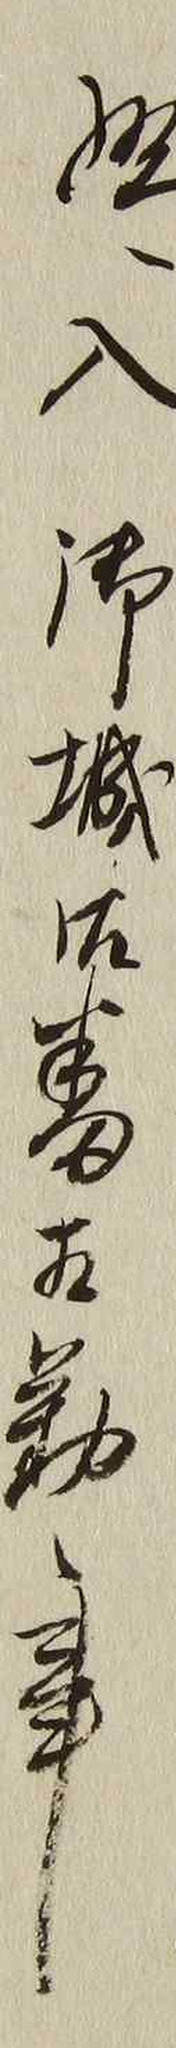組へ入御城御番相勤候事
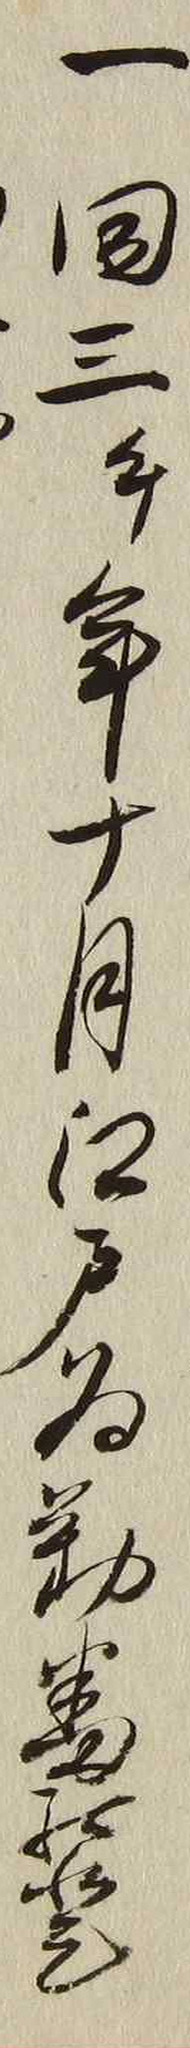一同三午年十月江戸為勤番罷登
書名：諸士系譜　巻之348　も之部4
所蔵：会津若松市立会津図書館
